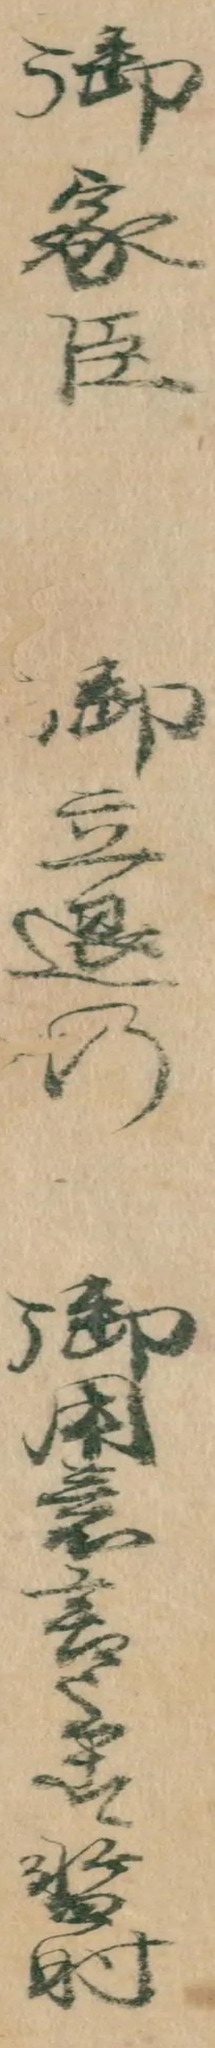御家臣御立退の御用意言上す暫時
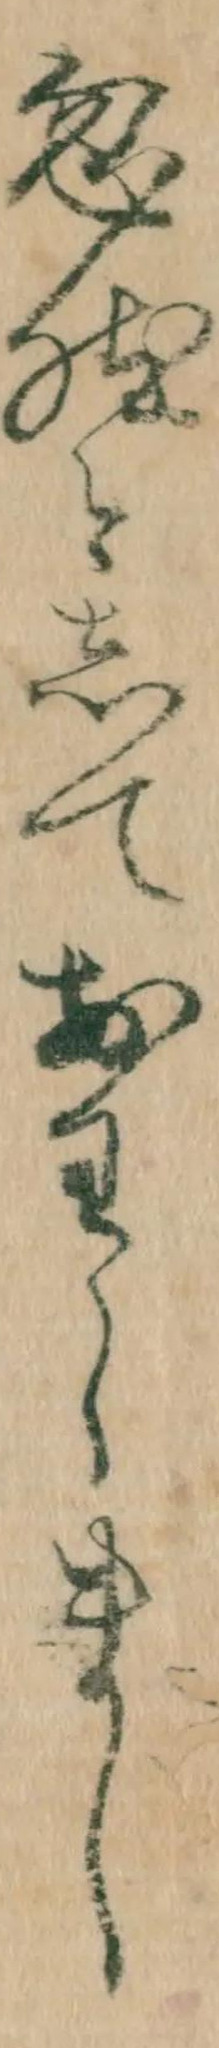忽然としておわしまし
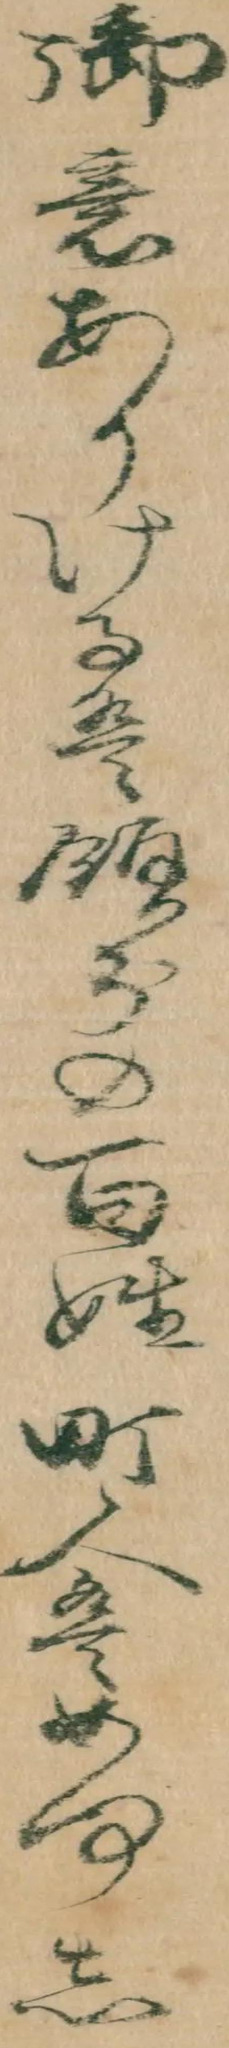御意ありけるは領分の百姓町人は如何し
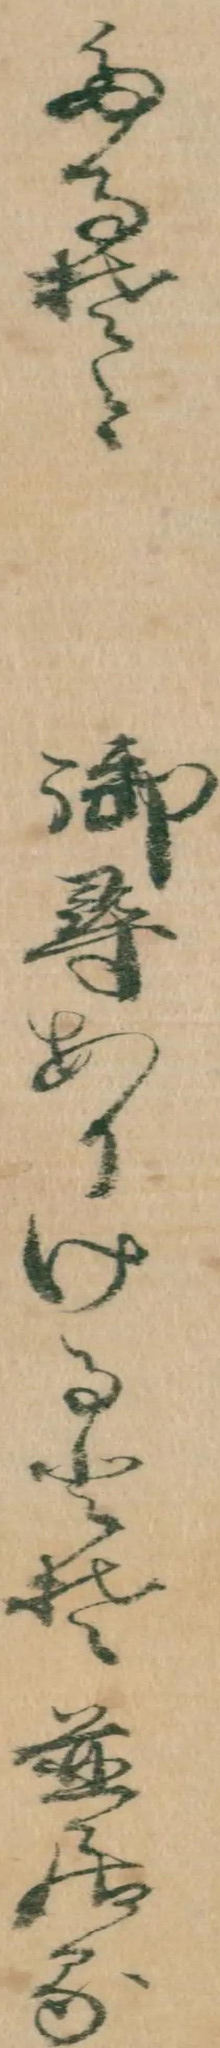たるそと御尋ありけるとそ並居る
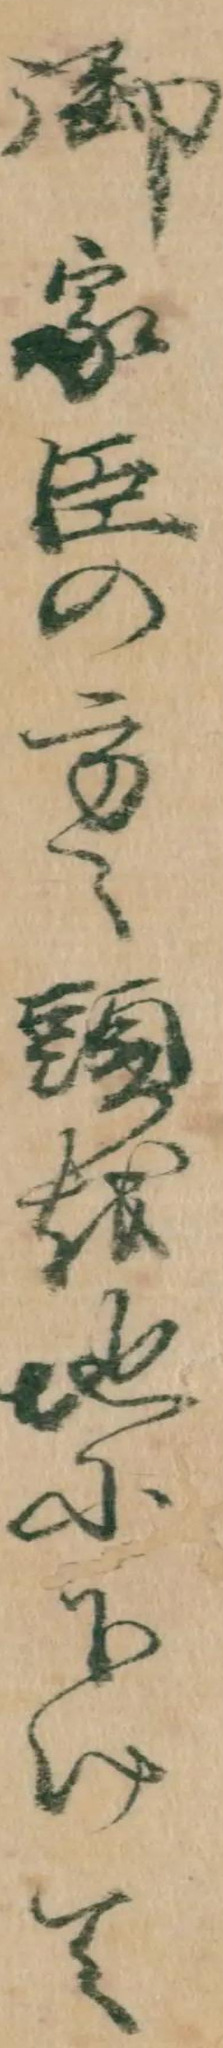御家臣の方〻頭を地に下けて
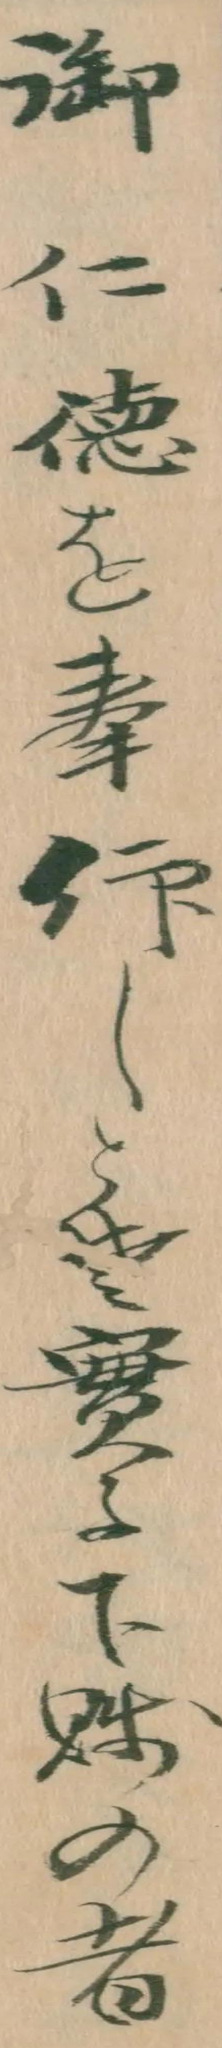御人徳を奉仰しとそ実に下賎の者
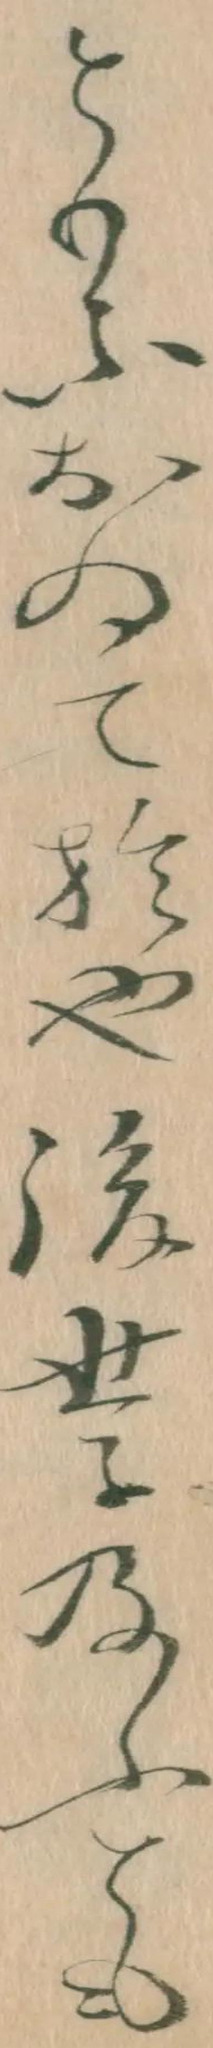ともふおゐておや後世に及ふとも
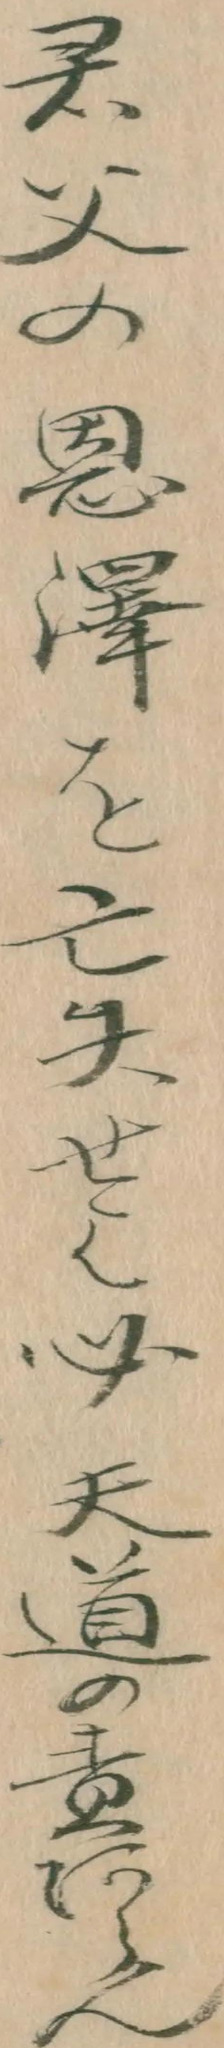君父の恩沢を亡失せは必天道の責あらん
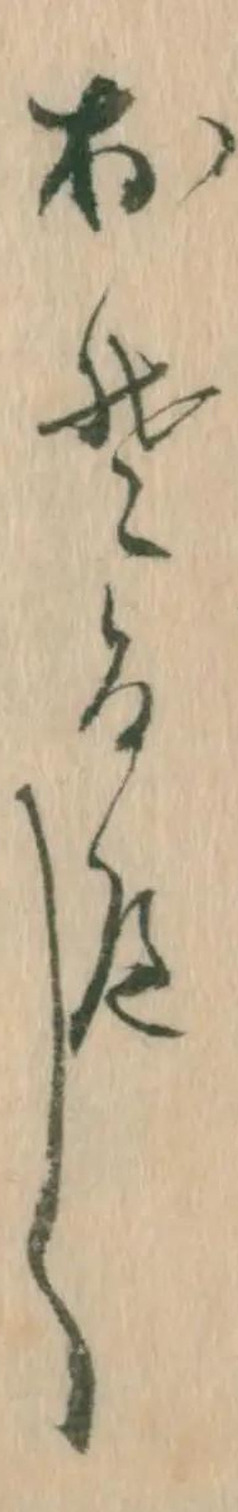おそるへし
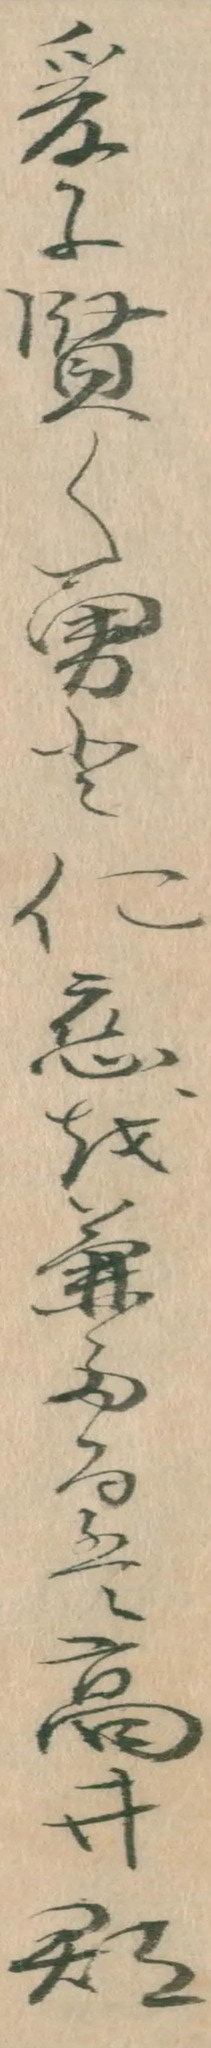爰に賢く勇と仁懇を兼たるは高井郡
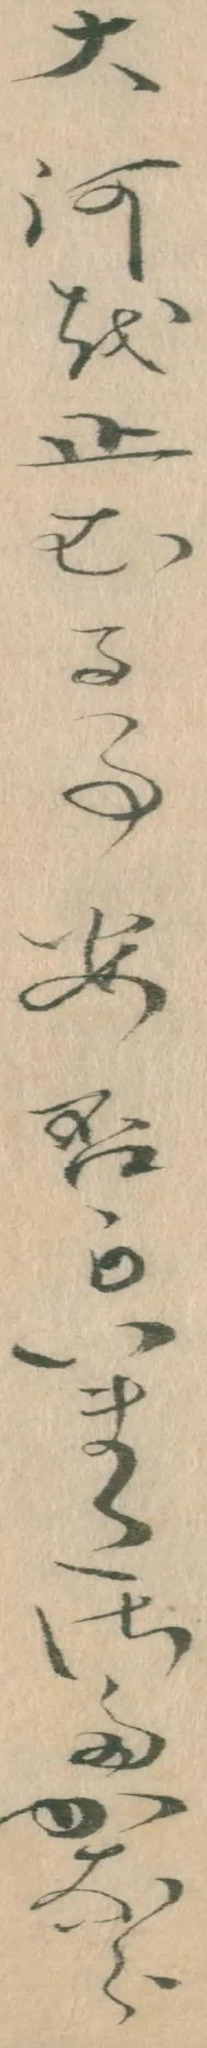大河を止むる事安否もいまたさたかなら
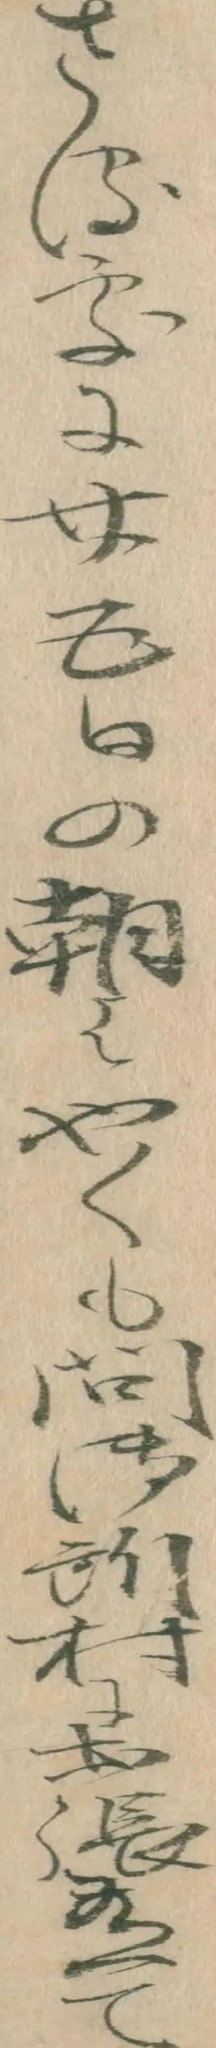さる処に廿五日の朝はやくも問御所村に出張有て

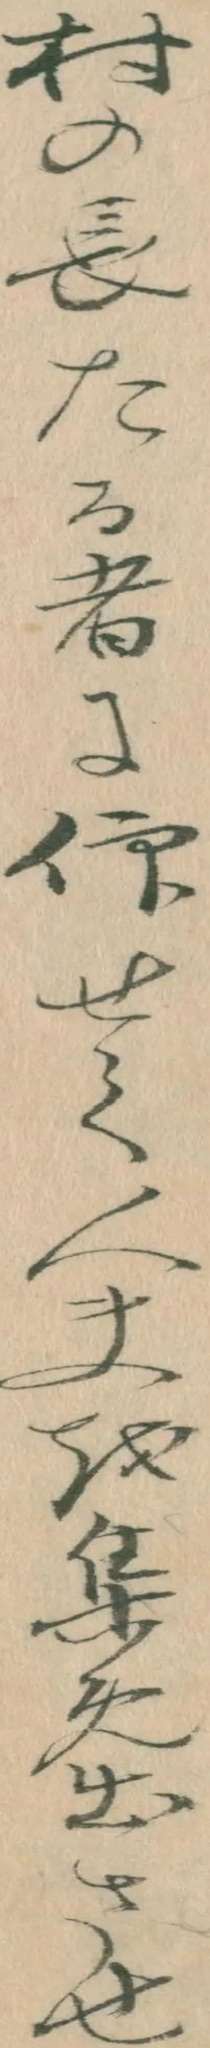村の長たる者に仰せて人夫を集め出させ
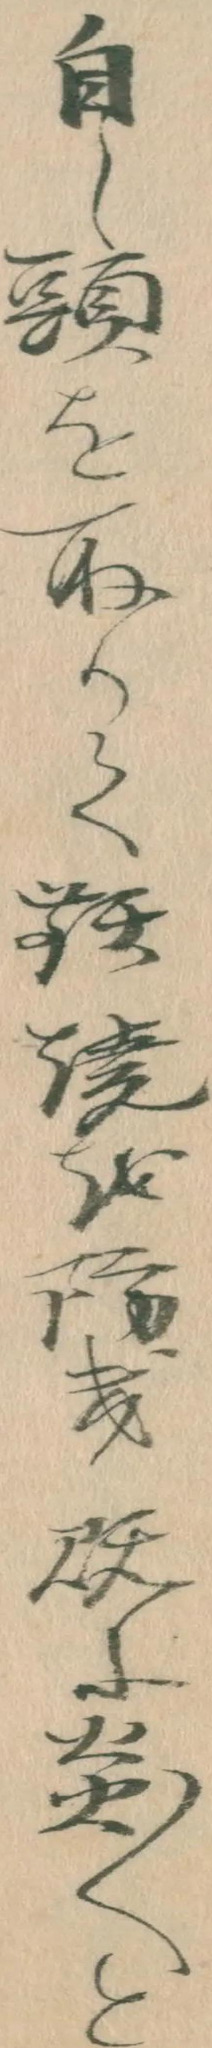自ら頭を取りて類焼を防き既に炎〳〵と
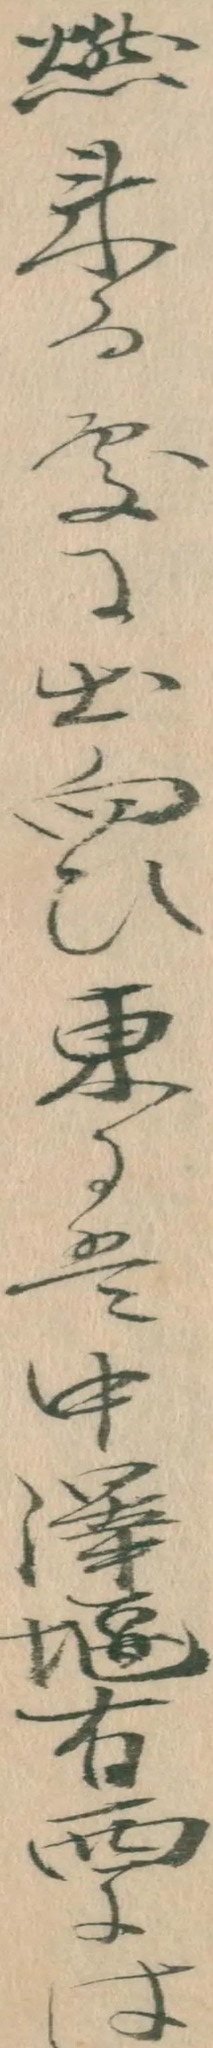燃来る処に出向ひ東には中澤堰有西には
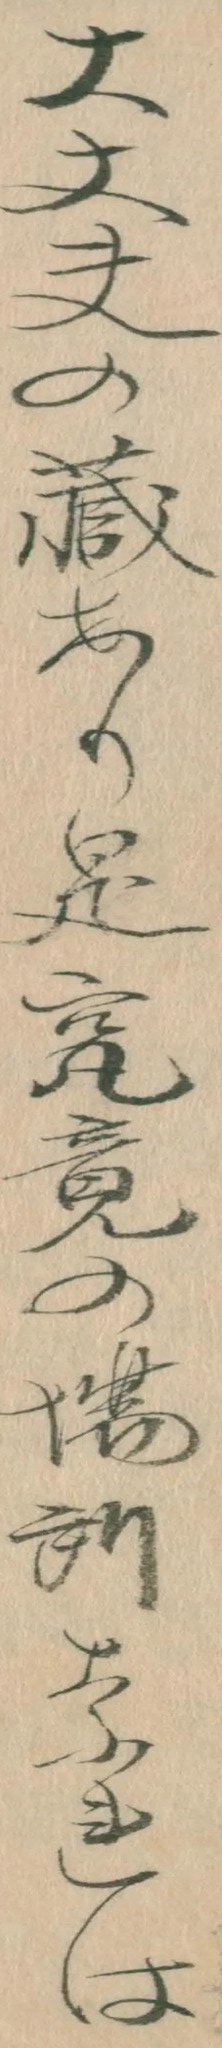大丈夫の蔵あり是究竟の場所なれは
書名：俗語之種. [6]
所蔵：国立国会図書館 National Diet Library, JAPAN
